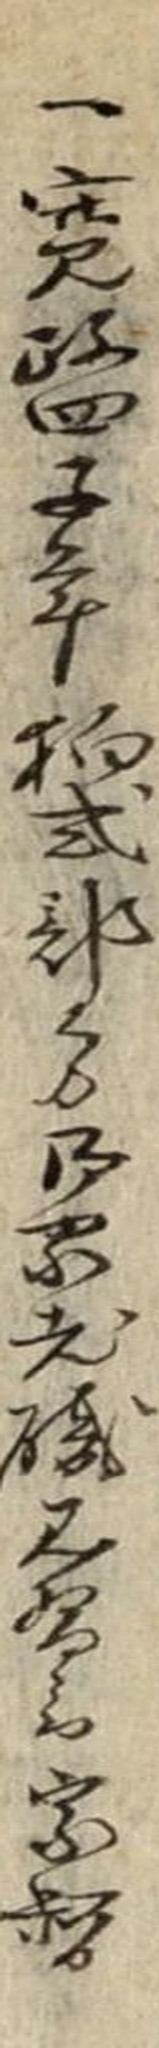一寛政四子年狛式部方御家老職見習に而家督
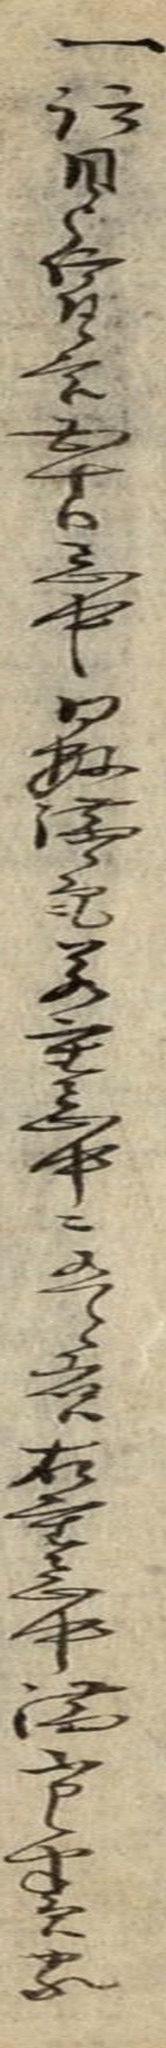一跡目被仰付候節五十日忌中日数満候而も若重忌中に有之者は右重忌中満不申候半而は家
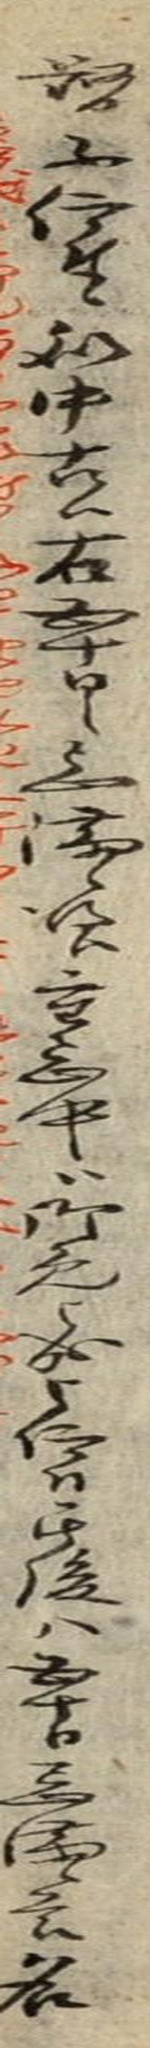督不被仰付候処中古は右五十日之忌満候得は重忌中は御免被成被仰付其後は五十日忌満候節名
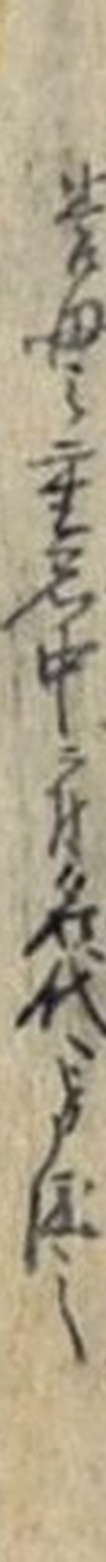養母之重忌中に付名代へ被申渡之
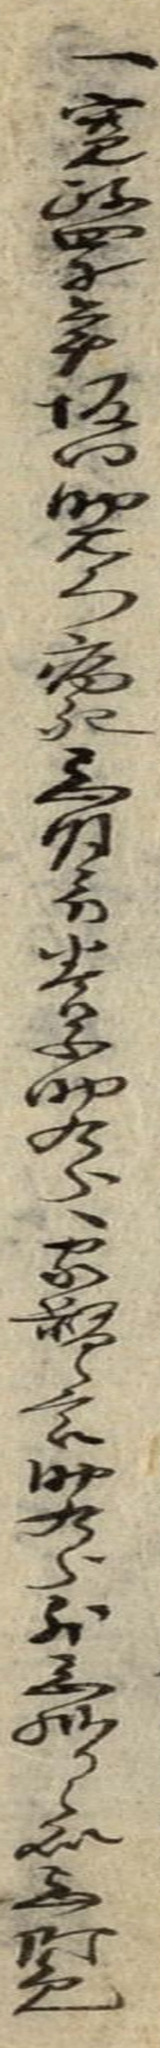一寛政四子年坂田助右衛門病死忌明に付養子助九郎へ家督之節助九郎外忌掛り候処忌御免
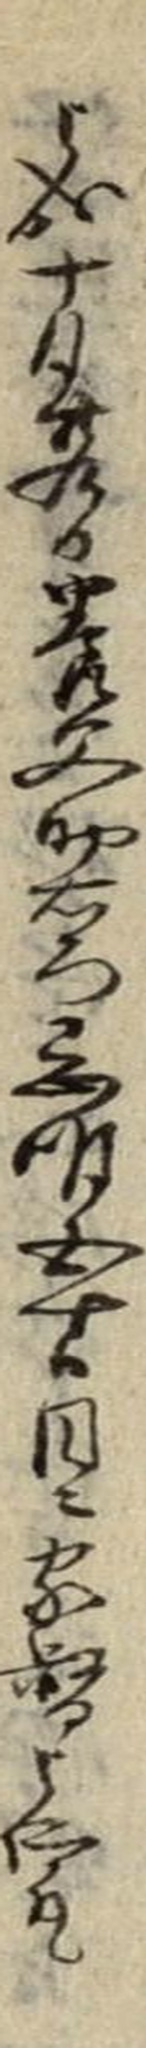被成十月廿九日養父助右衛門忌明五十日目に家督被仰付候
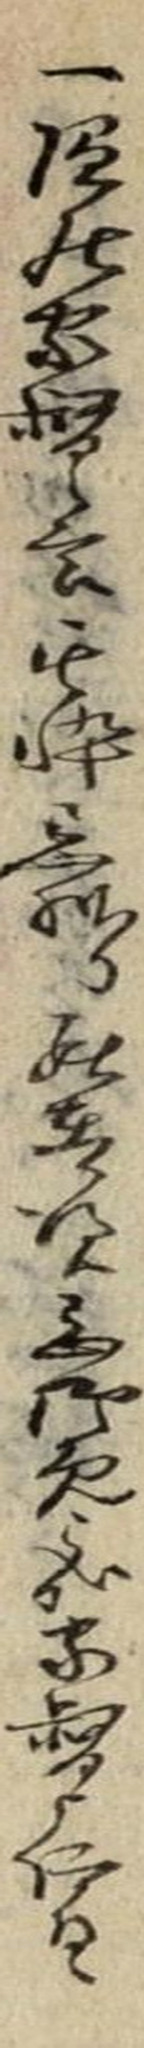一隠居家督之節其忰忌掛り罷在候得は忌御免被成家督被仰付候
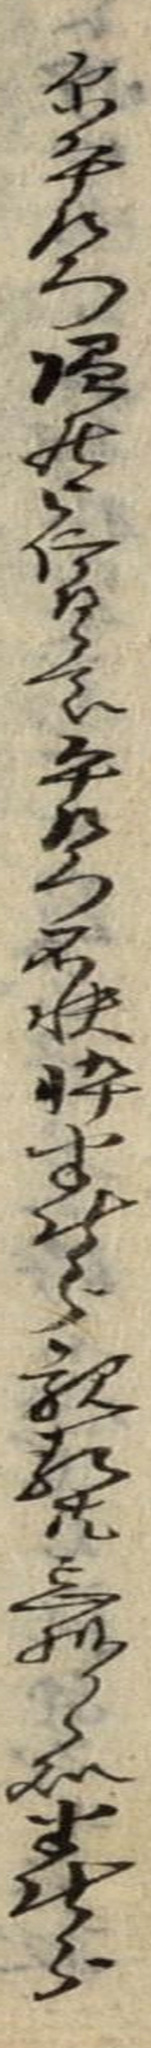一原平左衛門隠居被仰付候節平左衛門不快忰半次郎親類共忌掛り候処半次郎
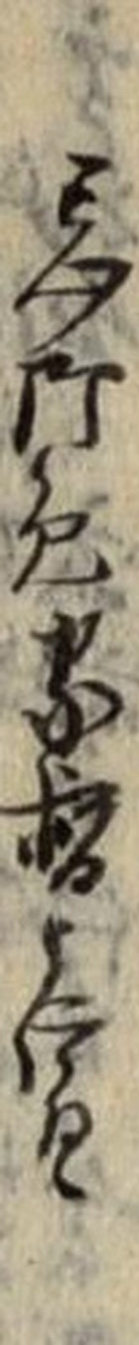忌御免家督被仰付候
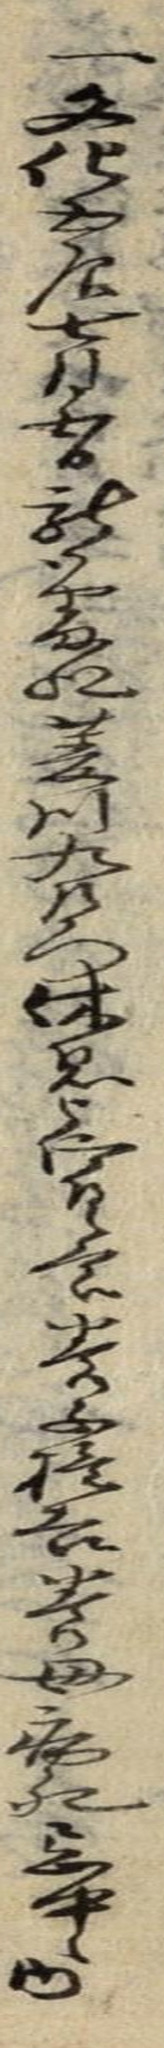一文化五辰七月五日新御番組菱川九左衛門休息被仰付候節養子権吉養母病死忌中之内
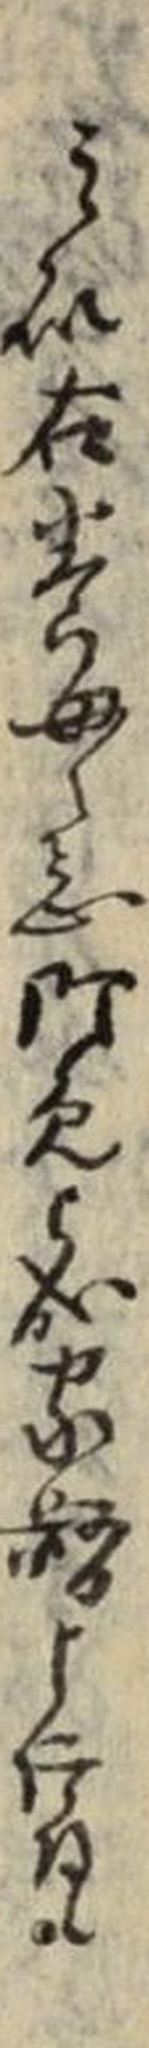に候処右養母之忌御免被成家督被仰付候
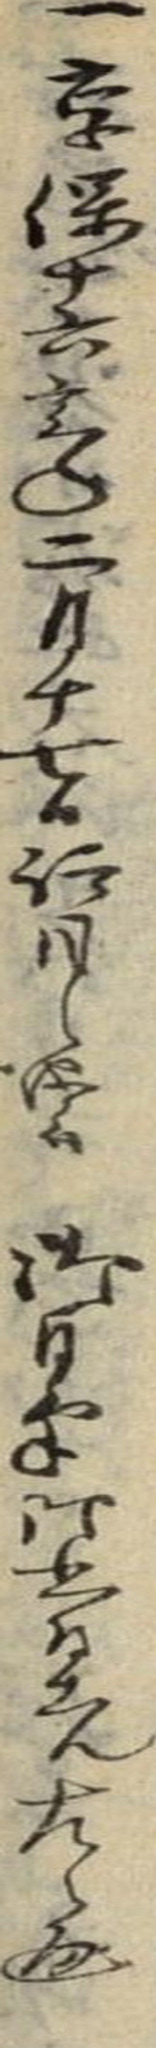一享保十六亥年二月十七日跡目之儀に付御自筆御書付出ル左之通
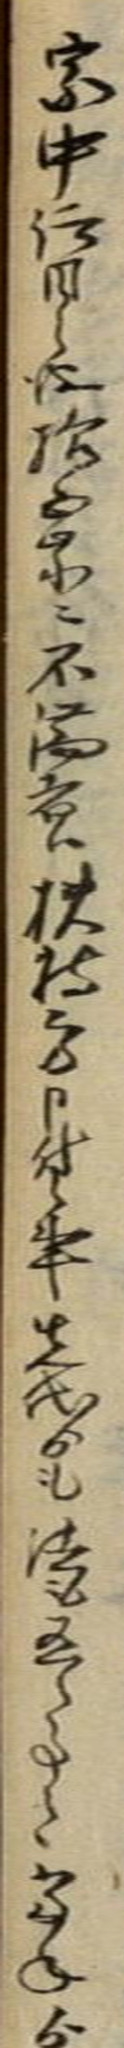家中跡目之儀拾五歳に不満候者は扶持方申付候事先代ゟも法も有之事候当年ゟ
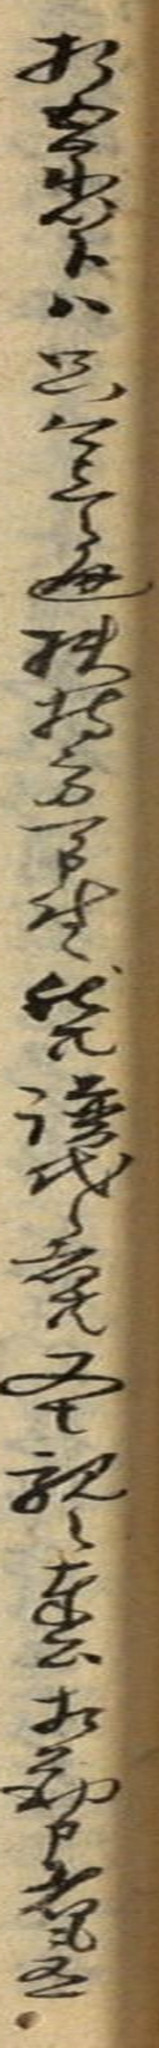拾五歳以下は只今迄之通扶持方可申付候然共譜代之者共又は親之奉公相勤申者も有
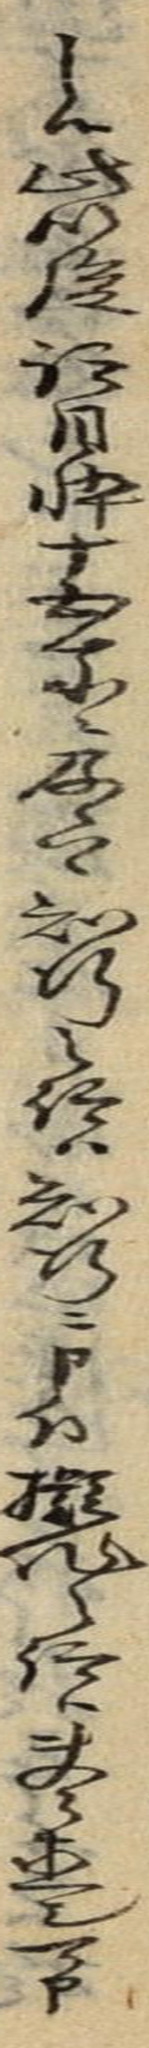之候此以後跡目忰十五歳に及候はゝ知行之跡は知行に申付擬作之跡は夫々直し可申
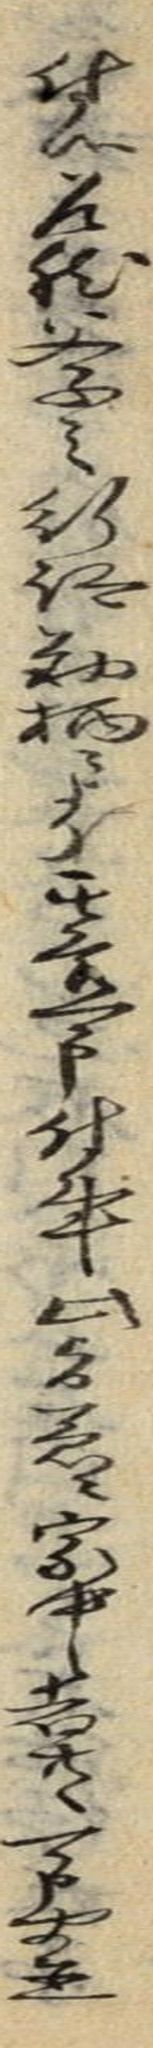付候乍然父子之行跡勤柄により其節可申付事此旨急々家中之者共へ可申聞置
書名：御用并被仰出之部
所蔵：福井県文書館 Fukui Prefectural Archives
